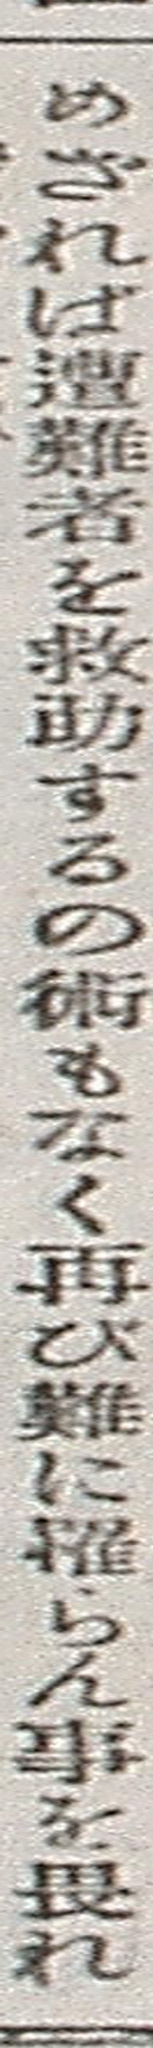めざれば遭難者を救助するの術もなく再び難に罹らん事を畏れ
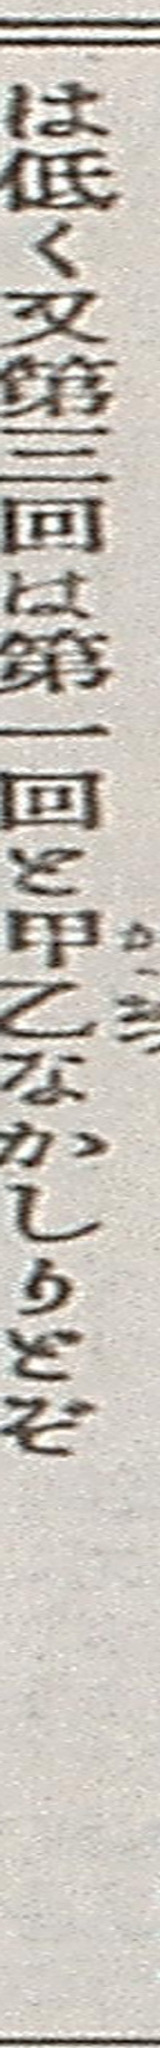は低く又第三回は第一回と甲乙なかりしとぞ
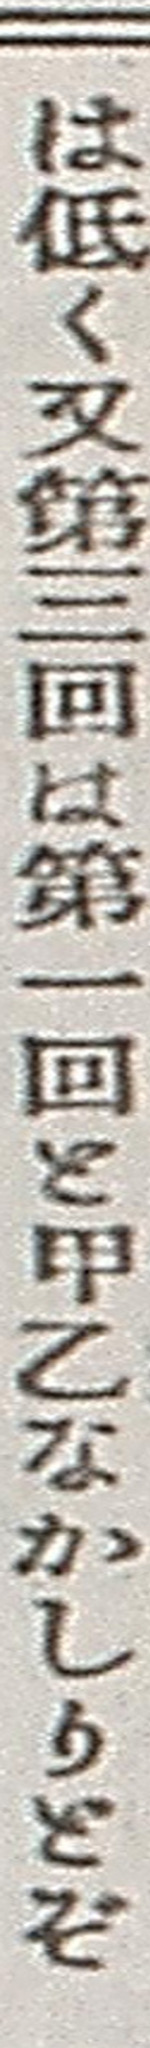は低く又第三回は第一回と甲乙なかりしとぞ
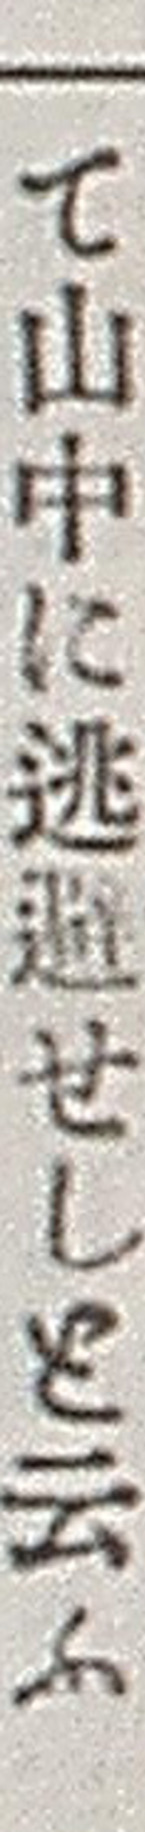て山中に逃避せしと云ふ
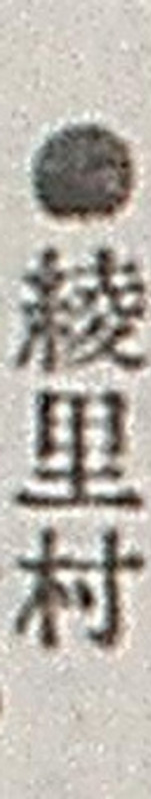●綾里村
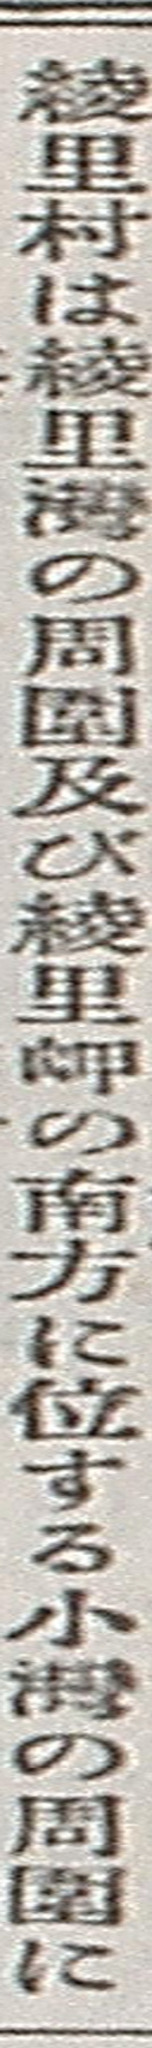綾里村は綾里湾の周囲及び綾里岬の南方に位する小湾の周囲に
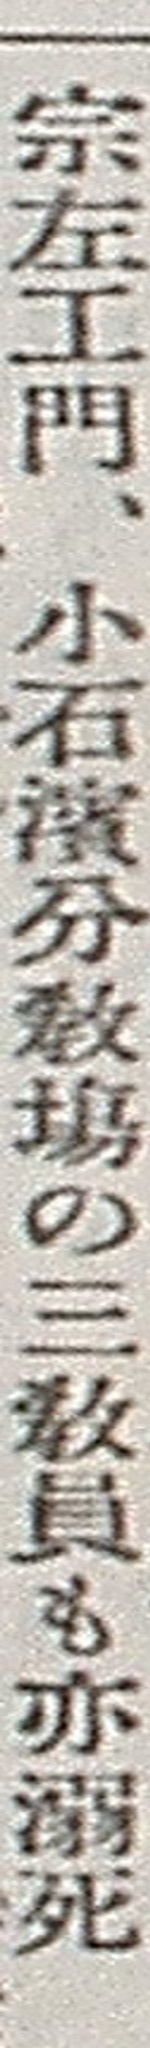崇左エ門、小石浜分教場の三教員も亦溺死
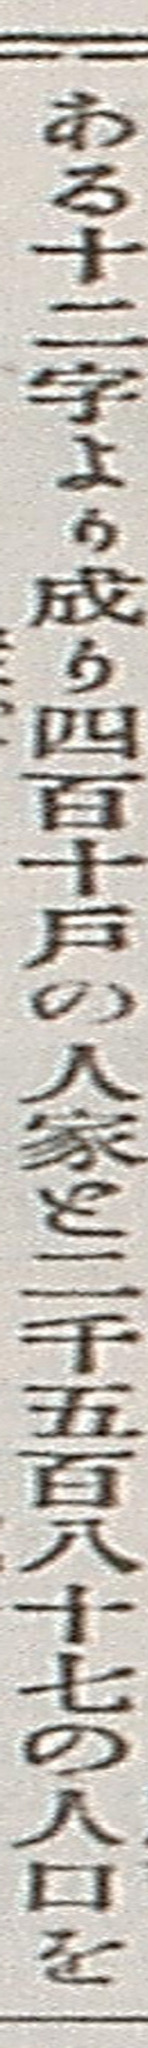ある十二字より成り四百十戸の人家と二千五百八十七の人口を
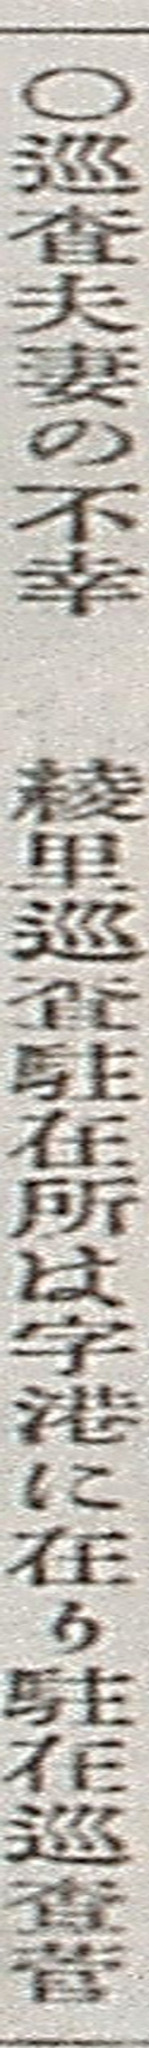○巡査夫妻の不幸綾里巡査駐在所は字港に在り駐在巡査菅
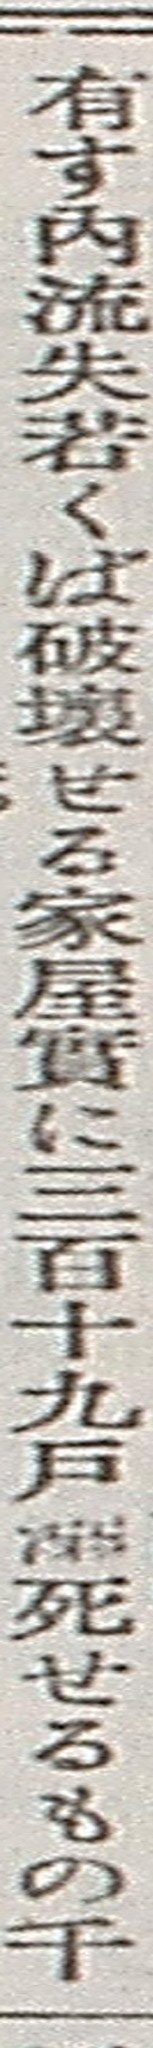有す内流失若くは破壊せる家屋実に三百十九戸溺死せるもの千
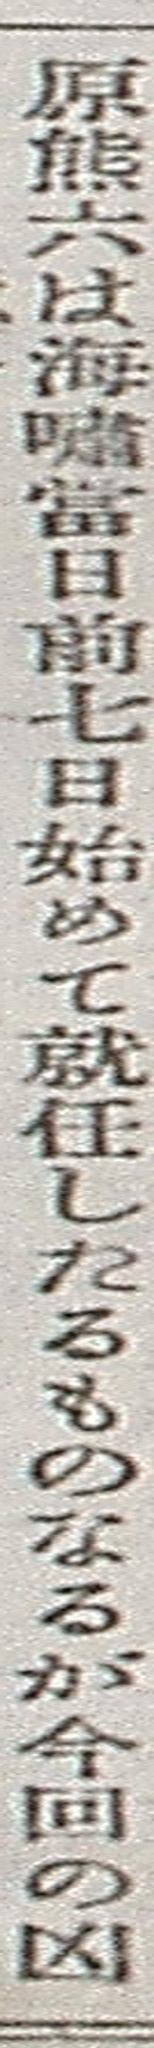原熊六は海嘯当日前七日始めて就任したるものなるが今回の凶
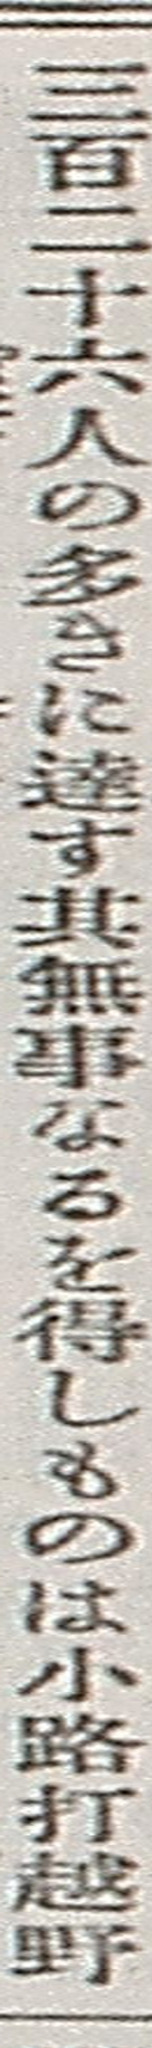三百二十六人の多きに達す其無事なるを得しものは小路打越野
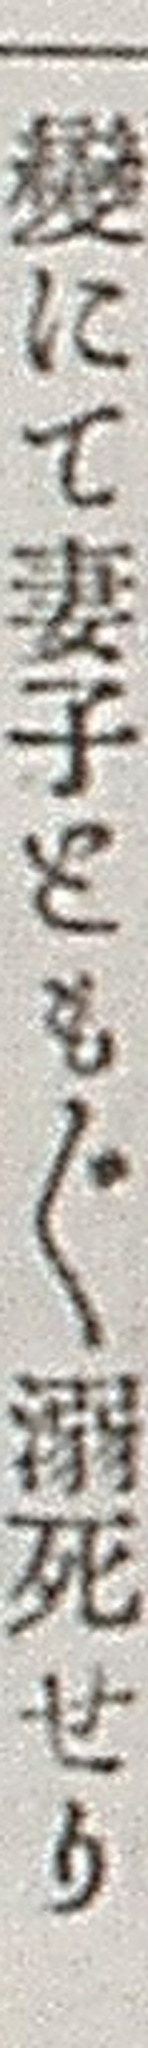変にて妻子とも〴〵溺死せり
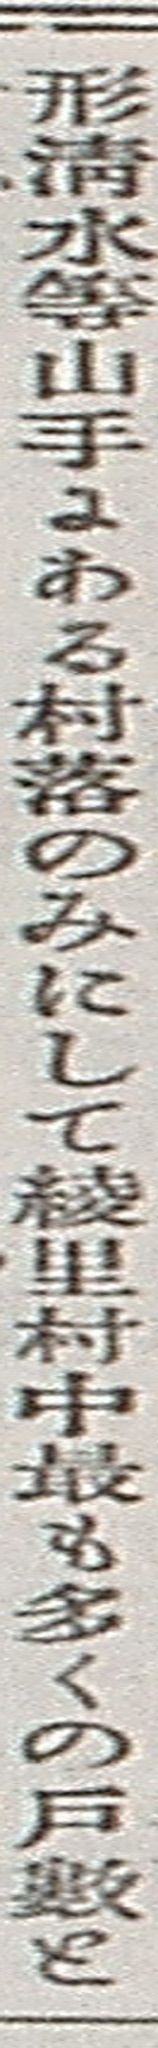形清水等山手にある村落のみにして綾里村中最も多くの戸数と
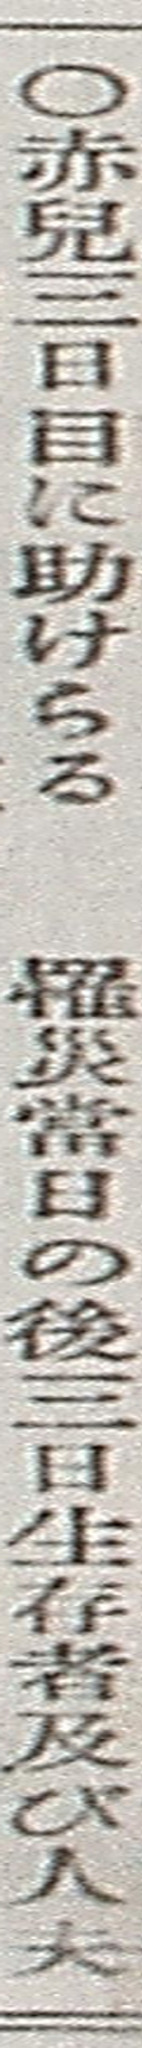○赤兒三日目に助けらる罹災当日の後三日生存者及び人夫
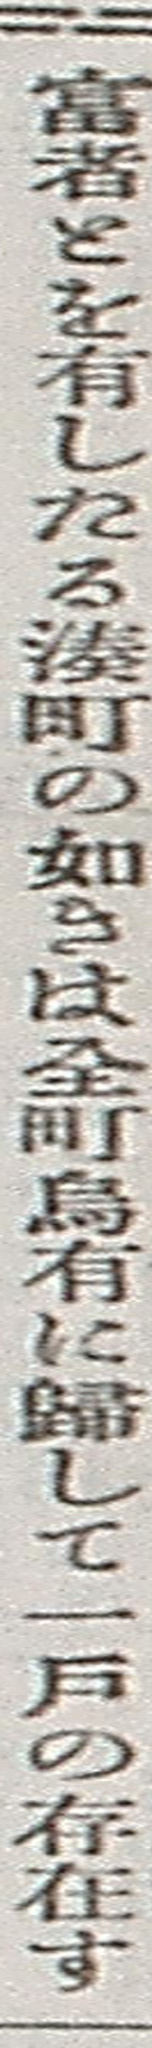富者とを有したる湊町の如きは全町烏有に帰して一戸の存在す
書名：風俗畫報臨時増刊第百二十號　大海嘯被害録（下）
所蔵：東京大学地震研究所図書室 Earthquake Research Institute Library, The University of Tokyo, JAPAN
